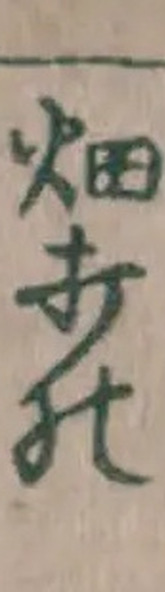畑打の
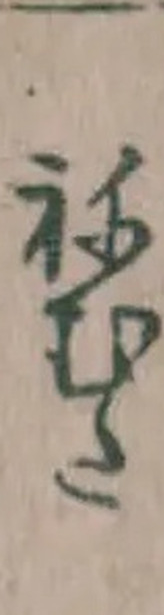ねむた
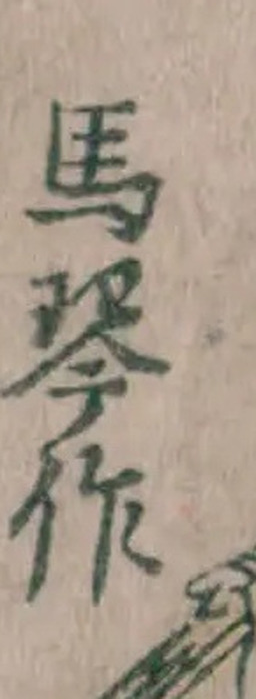馬琴作
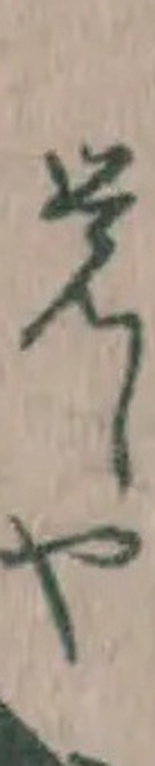覚しや
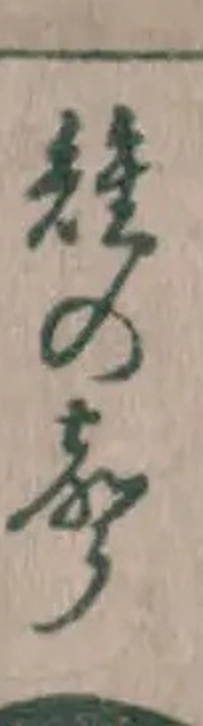雉の声
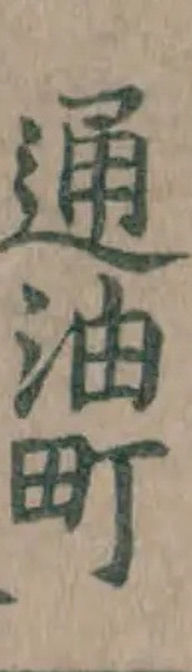通油町
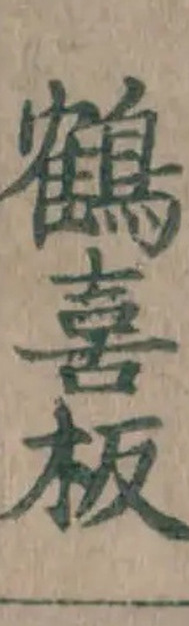鶴喜板

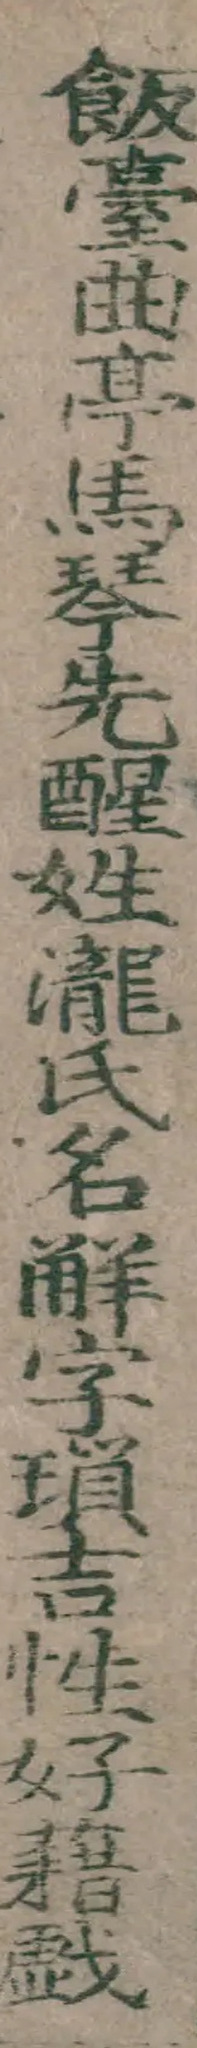飯台曲亭馬琴先醒姓瀧氏名解字瑣吉性好籍戯
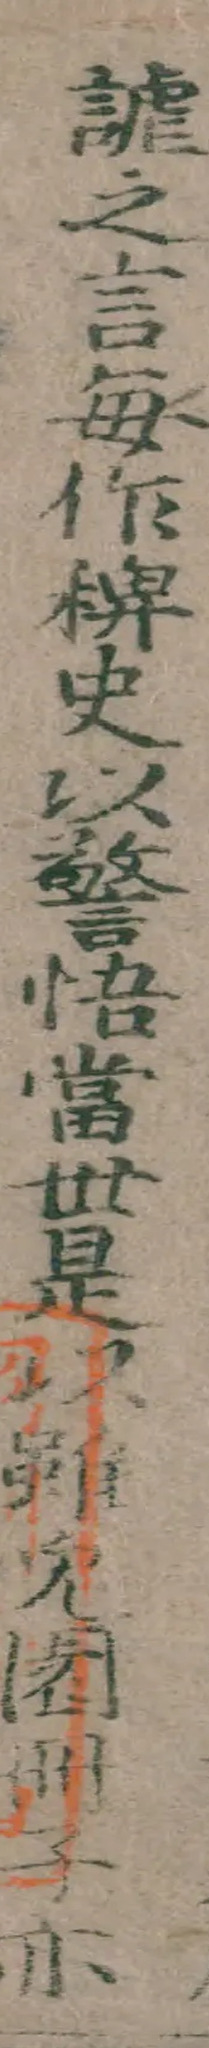謔之言毎作稗史以警悟当世是以雖免園冊子亦
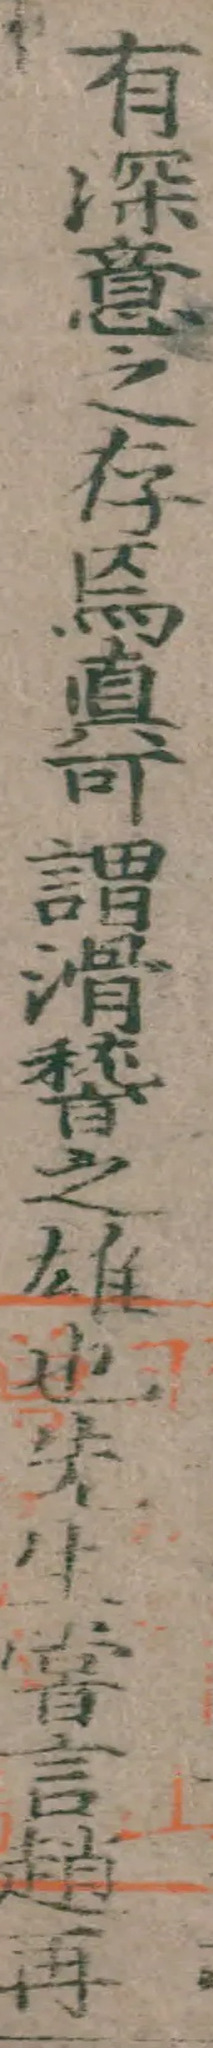有深意之存焉真可謂滑稽之雄也先生嘗言趙再
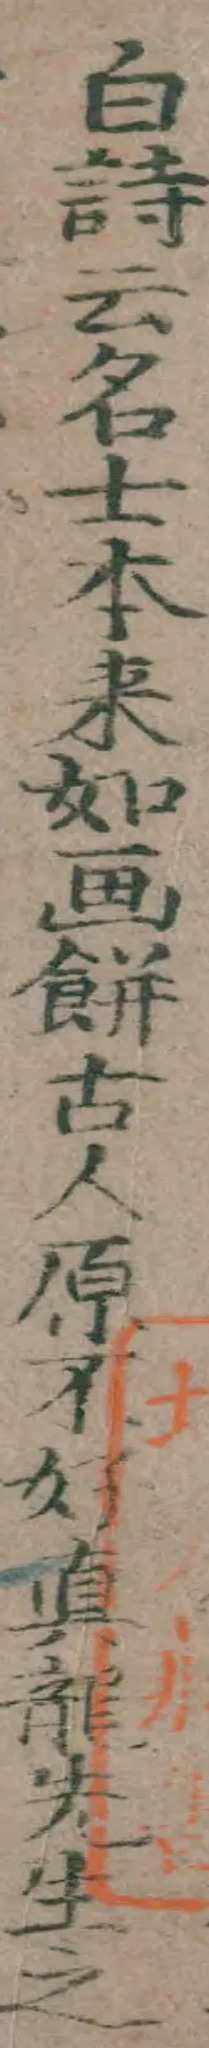白詩云名士本来如画餅古人原不好真龍先生之
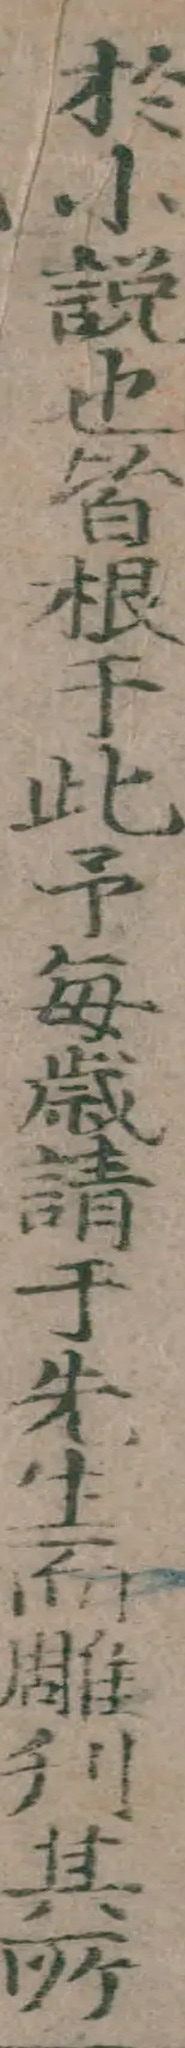於小説也皆根于此予毎歳請于先生而雕刊其所
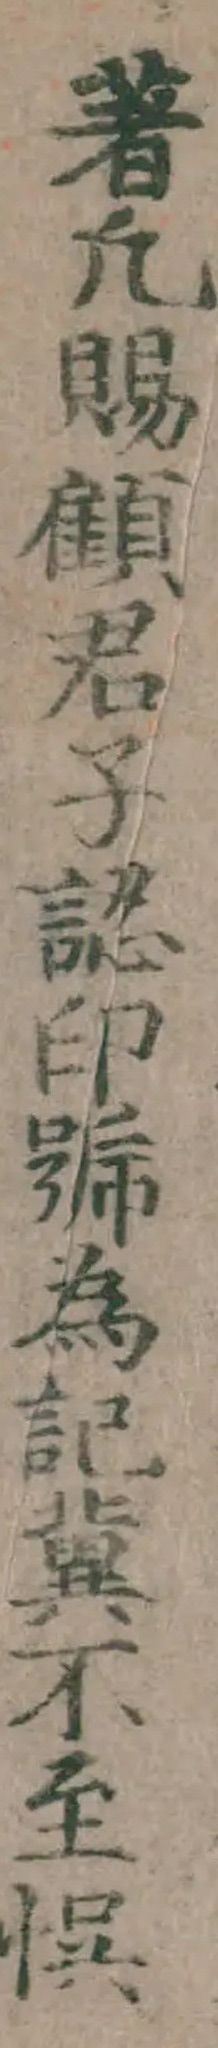著凡賜顧君子認印号為記冀不至悞
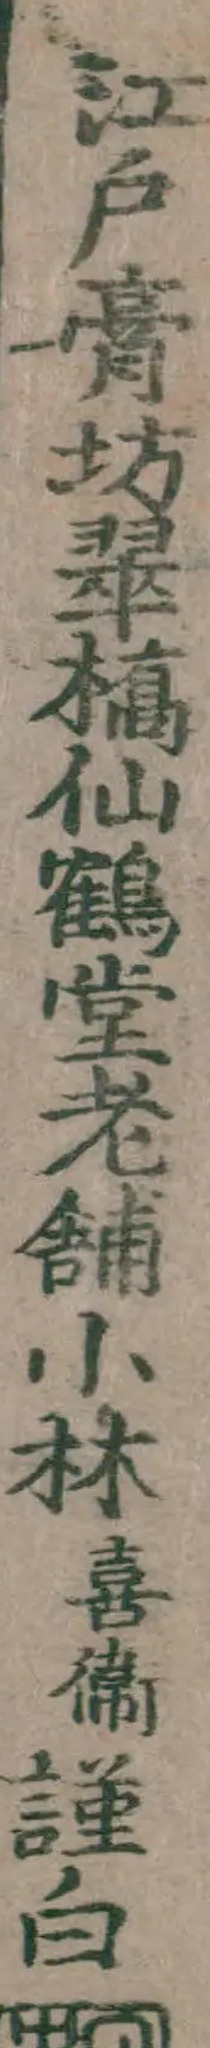江戸膏坊翠橋仙鶴堂老舗小林喜衛謹白
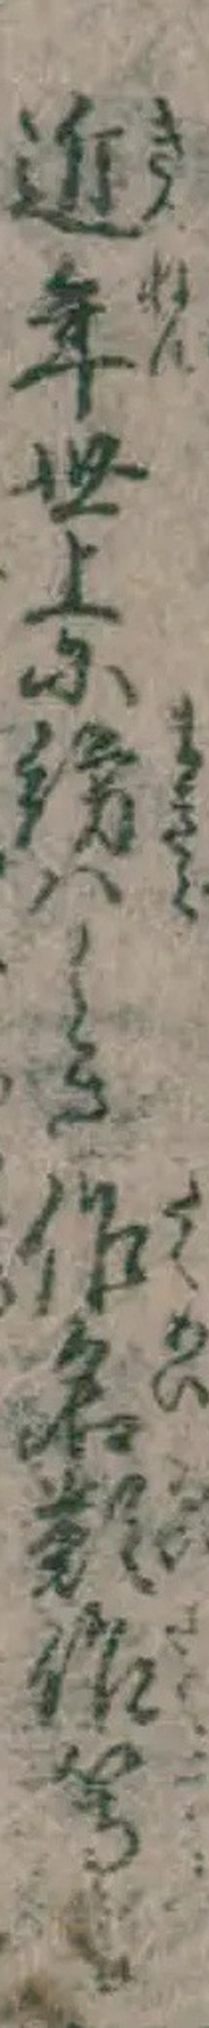近年世上に紛はしき作名類作等
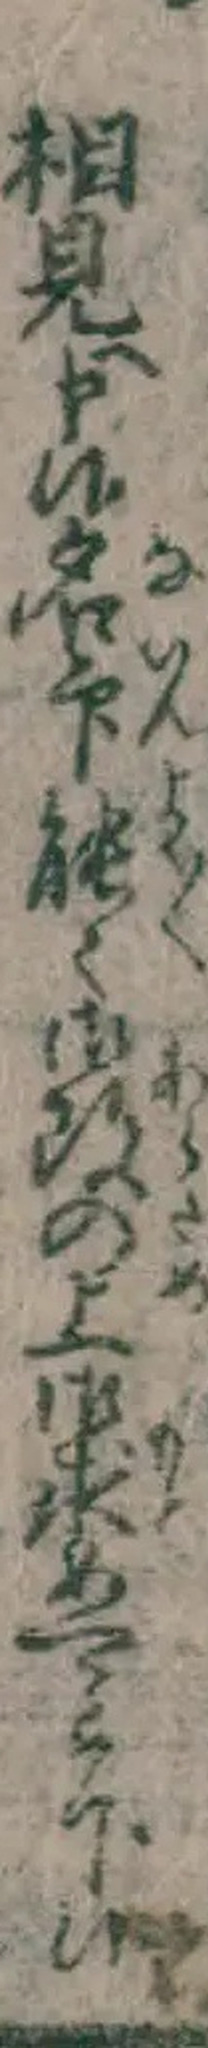相見申候名印能ゝ御改の上御求め可被下候
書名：視薬霞報条 3巻
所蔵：国立国会図書館 National Diet Library, JAPAN
